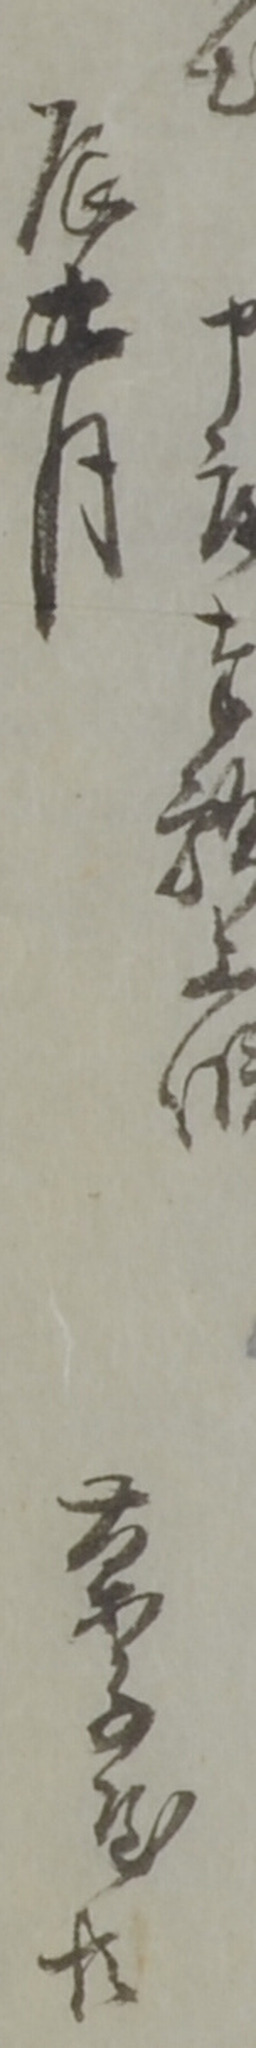辰十一月菓子屋共
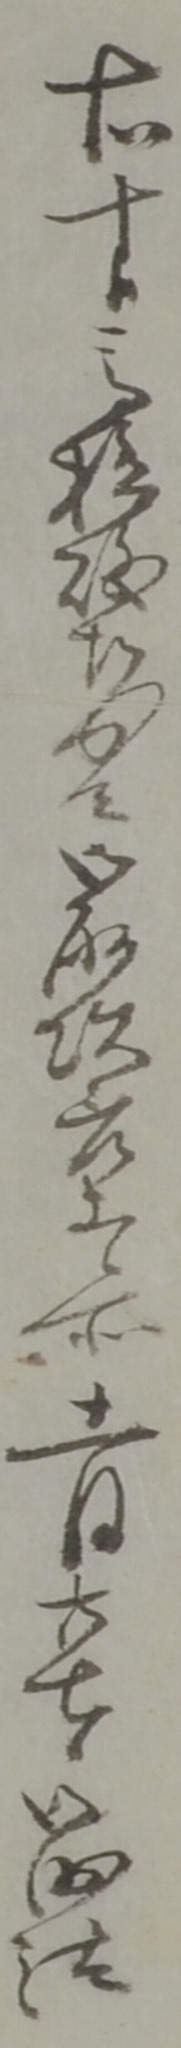右十日高橋磯左衛門殿御取次差上候所十一月廿七日御沙汰
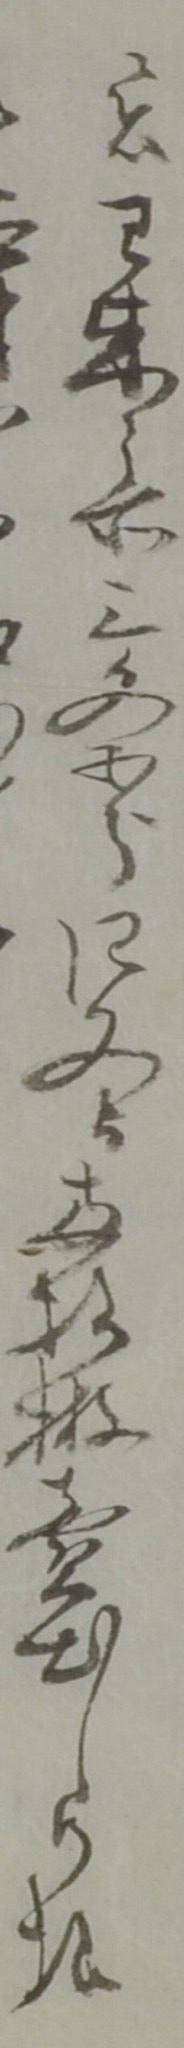ニ者已来之所三文五分四文与両様拵売出候様
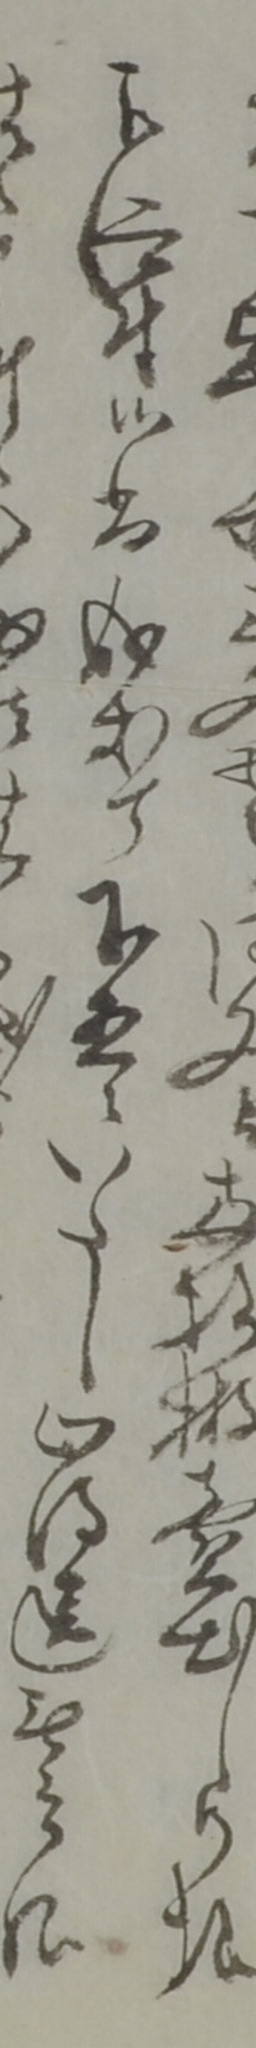被仰付候尚成丈ケ下直ニいたし心得違無之様
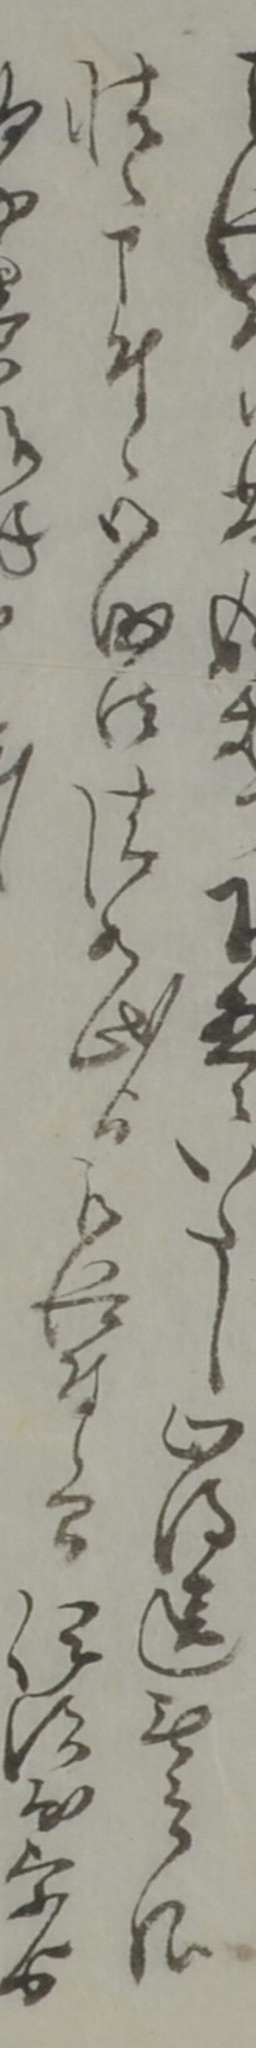慥ニ申付候御沙汰清水氏ゟ被仰付候間伊沢屋宗右衛門
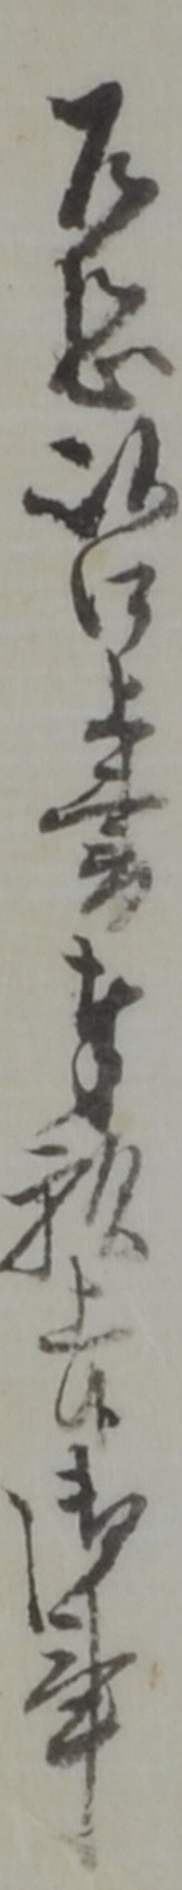乍恐以口上書奉願上候御事
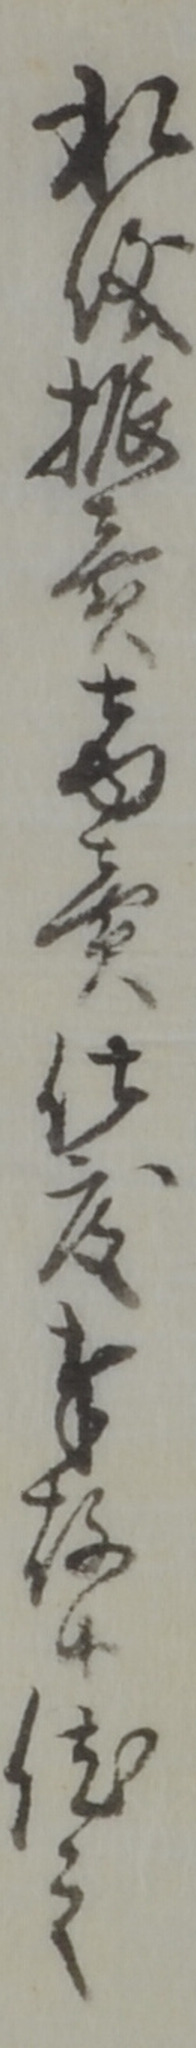私儀振売商売仕度奉存候依之
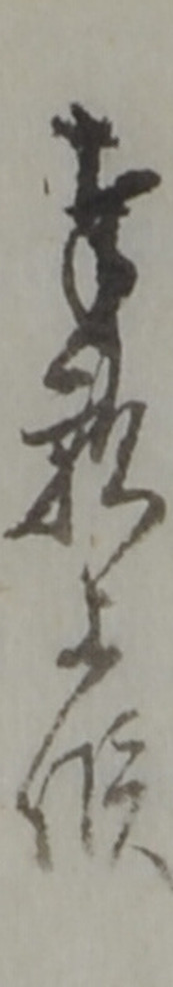奉願上候
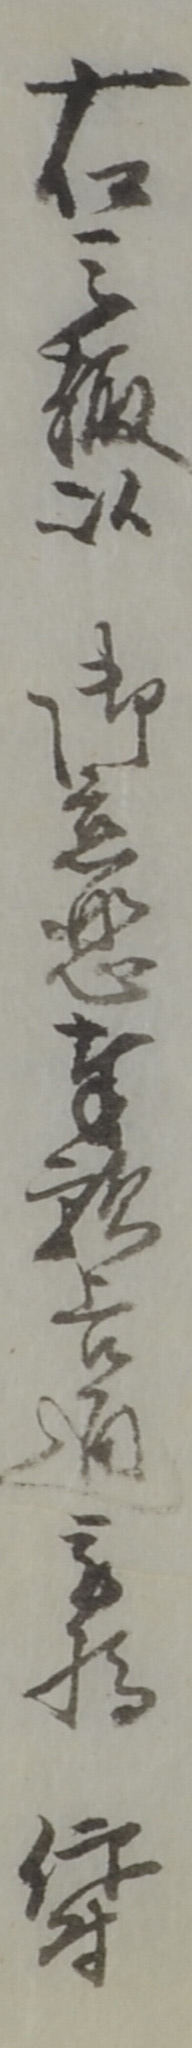右之趣以御慈悲奉願上候通被為仰付
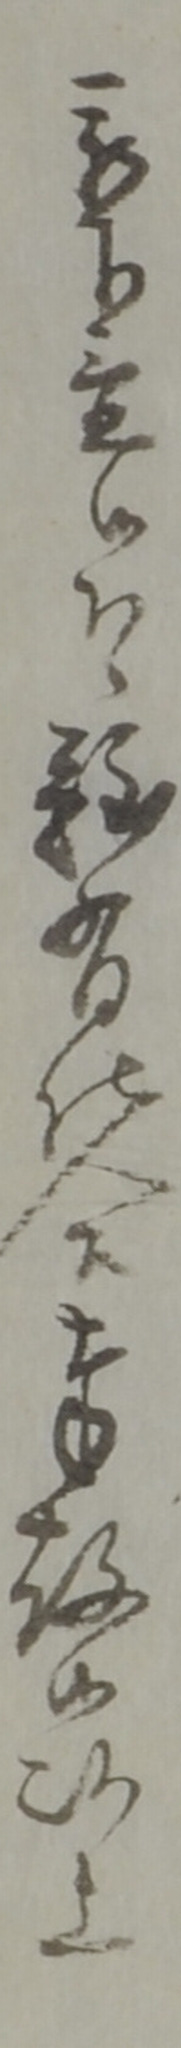被下置候ハヽ難有仕合奉存候以上
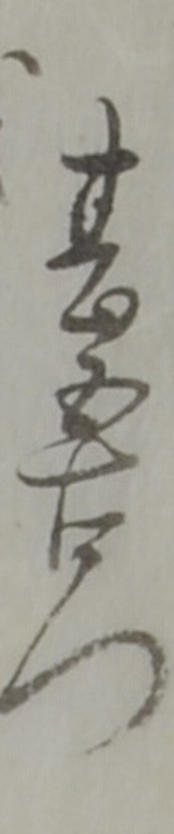甚五右衛門
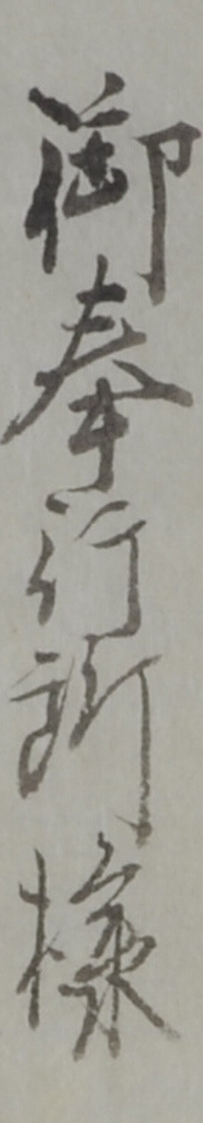御奉行所様
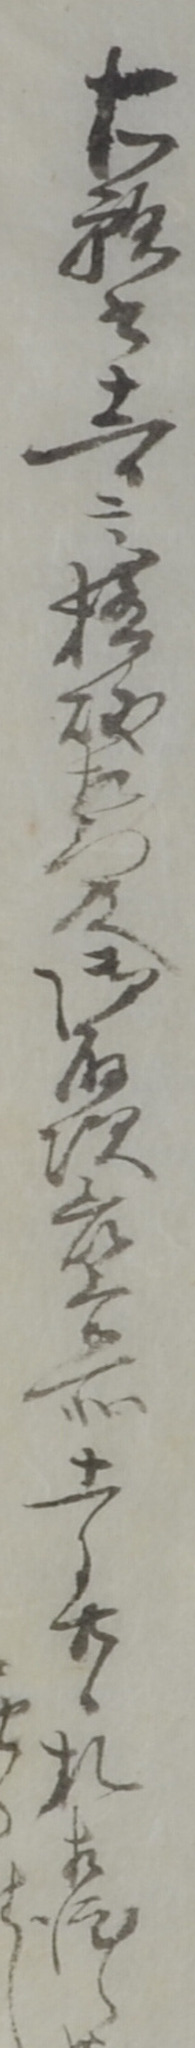右願書十二日高橋磯左衛門殿御取次差上候所十一月廿日

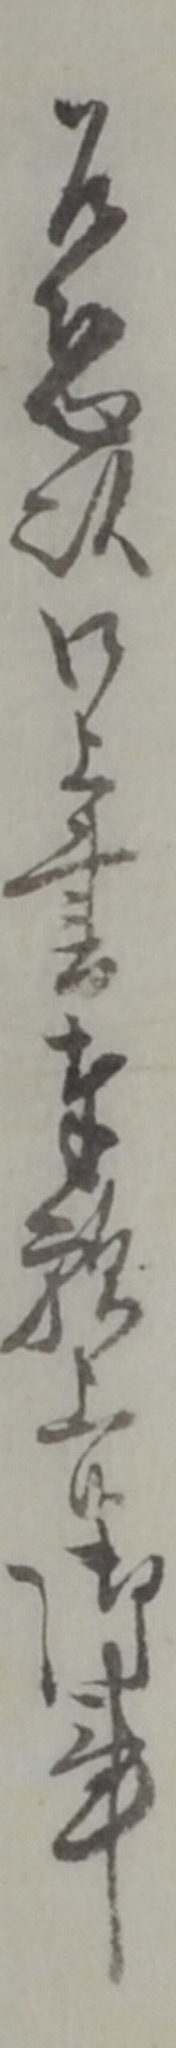乍恐以口上書奉願上候御事
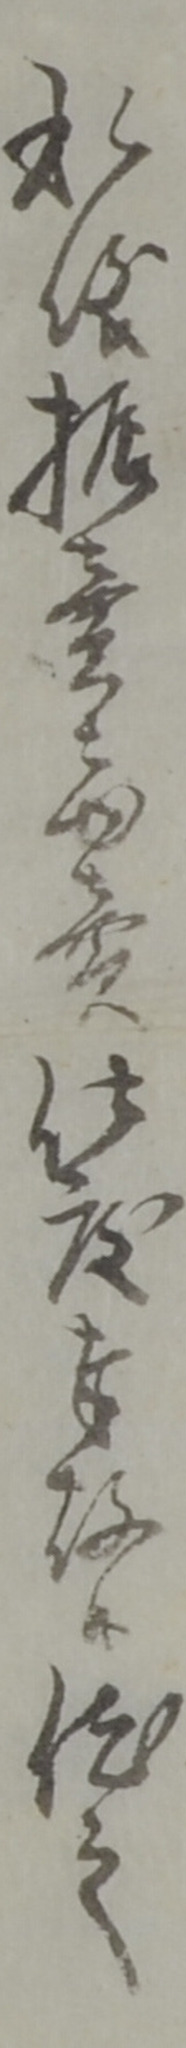私儀振売商売仕度奉存候依之
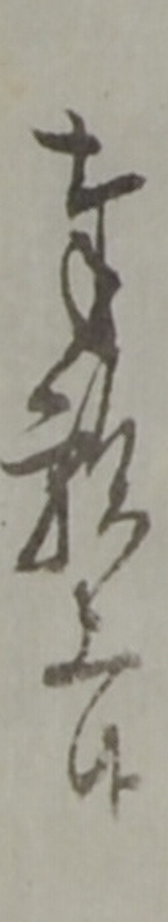奉願上候
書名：諸願書控簿
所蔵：伊那市立高遠町図書館・合同会社AMANE
